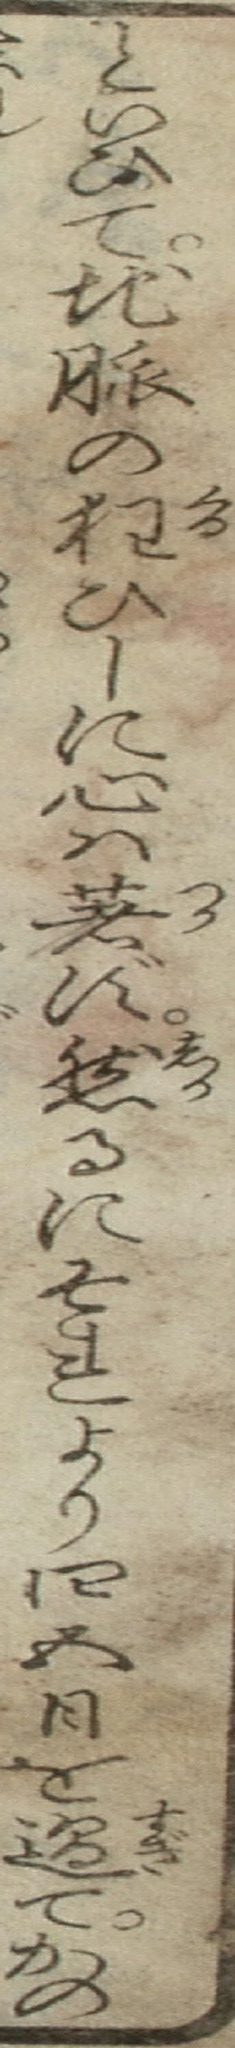といひて。地脈の狂ひしに心は著ず。然るにそれより四五日を過て。かの
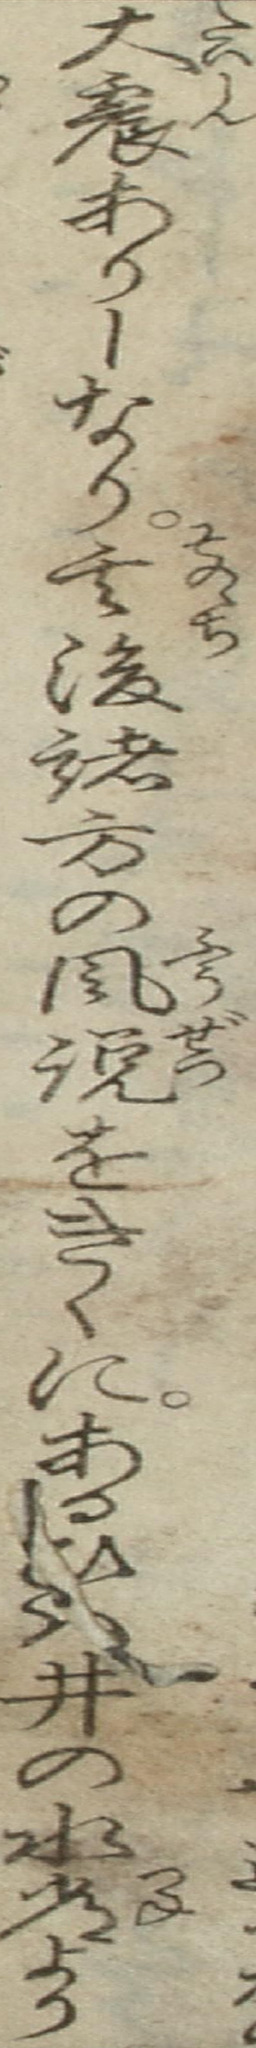大震ありしなり。其後諸方の風説をきくに。あるひは井の水常より
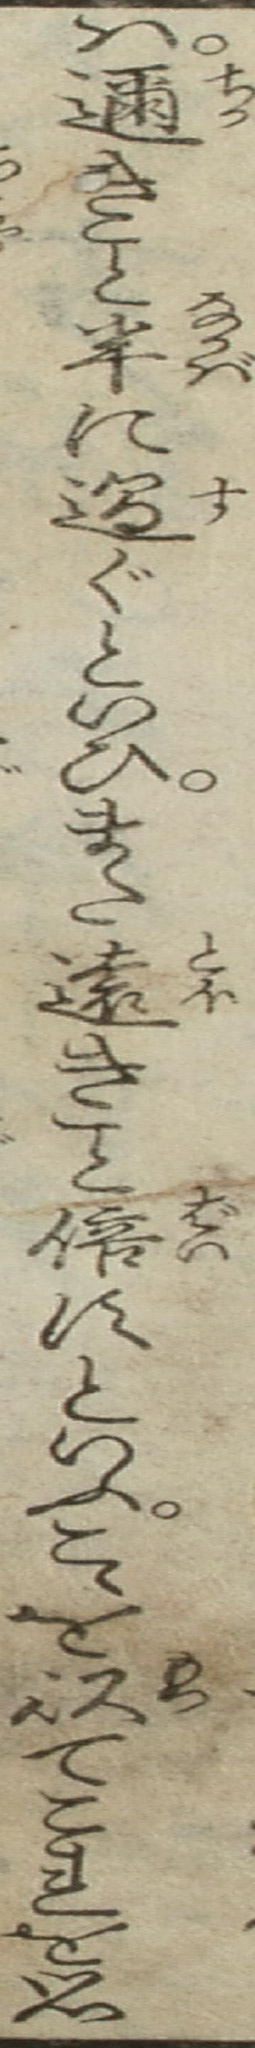は。邇きこと半に過ぐといひ。また遠きこと倍すといふ。こゝを以てこれを思
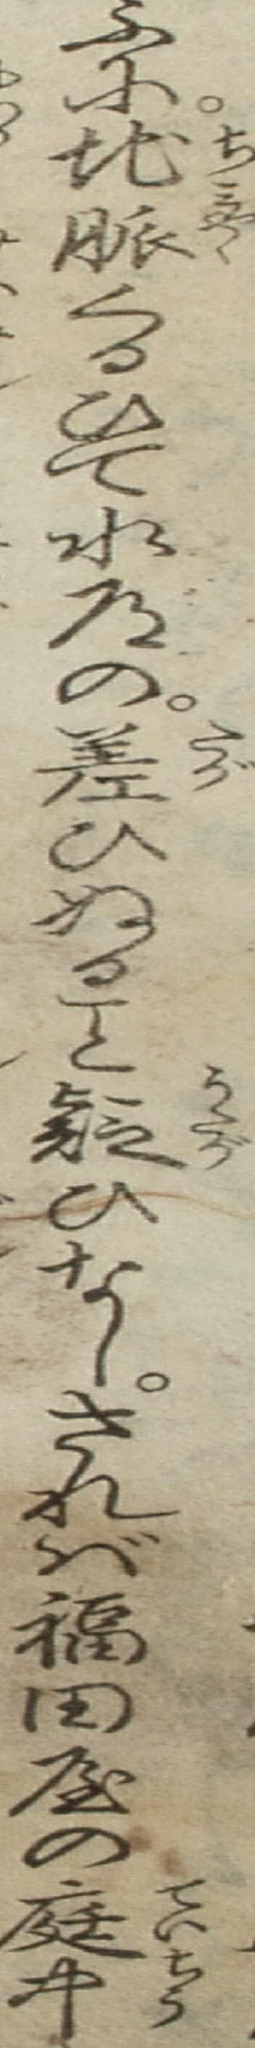ふに。地脈くるひて水道の。差ひぬること疑ひなし。されば福田屋の庭中
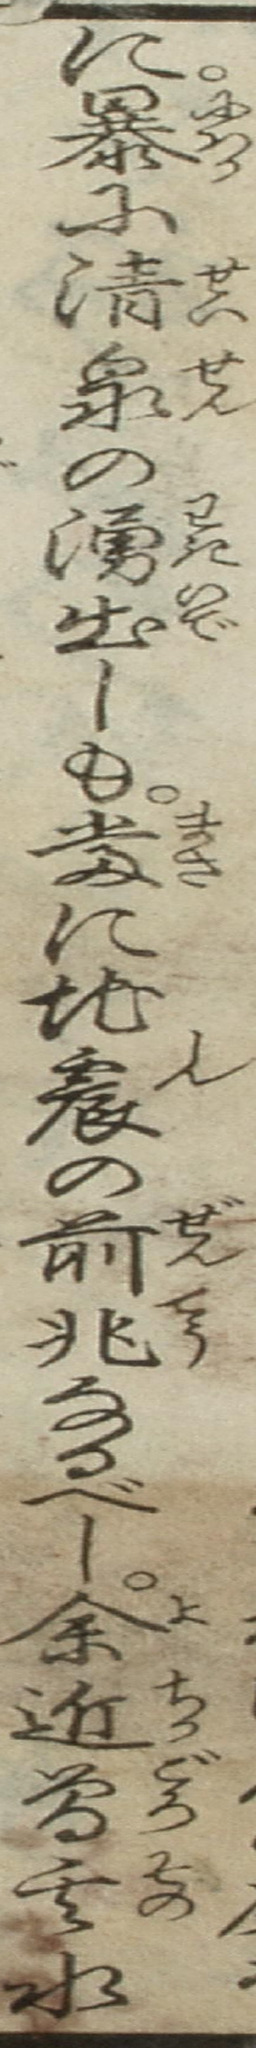に。暴に清泉の湧出しも。當に地震の前兆なるべし。余近曽其水
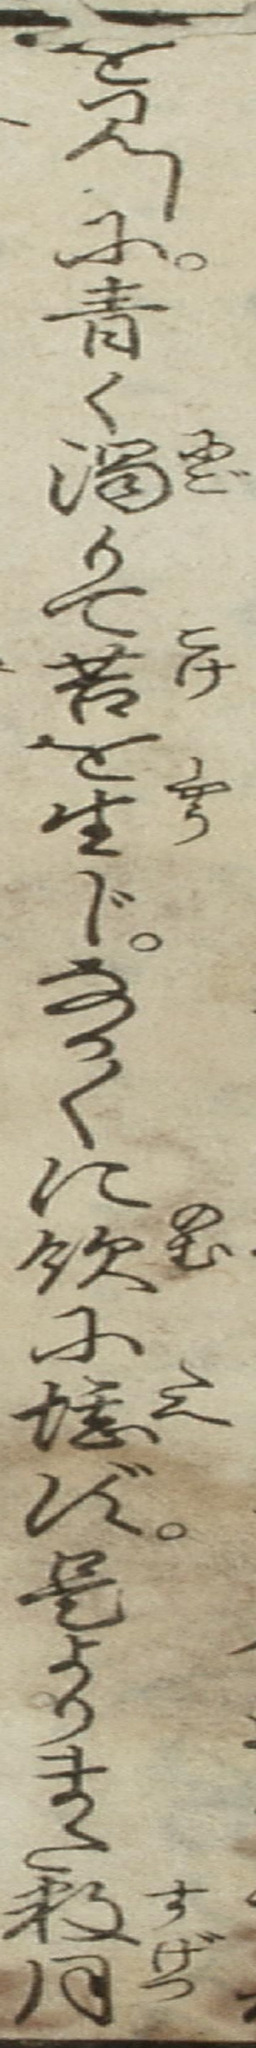を見しに。青く濁りて苔を生じ。なか〳〵に飲に堪ず。是よりまた数月
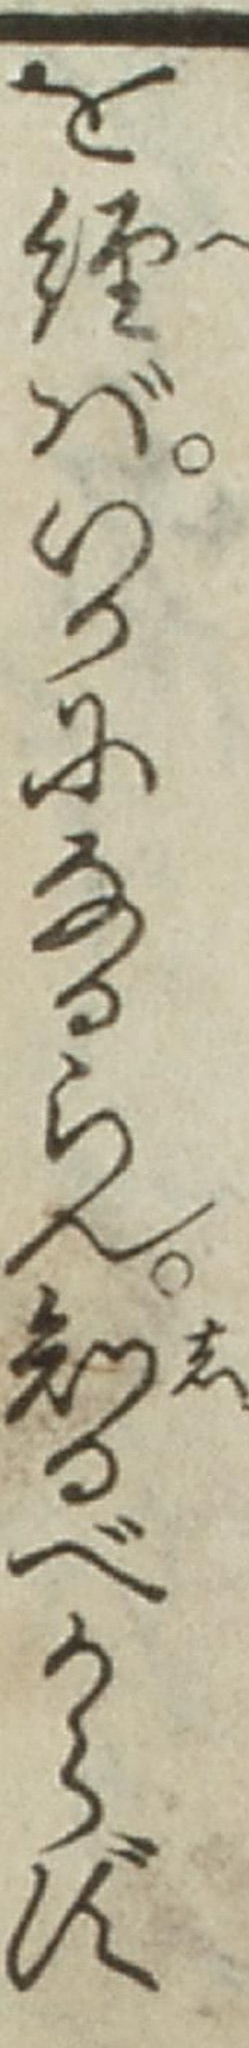を経ば。いかになるらん。知るべからず
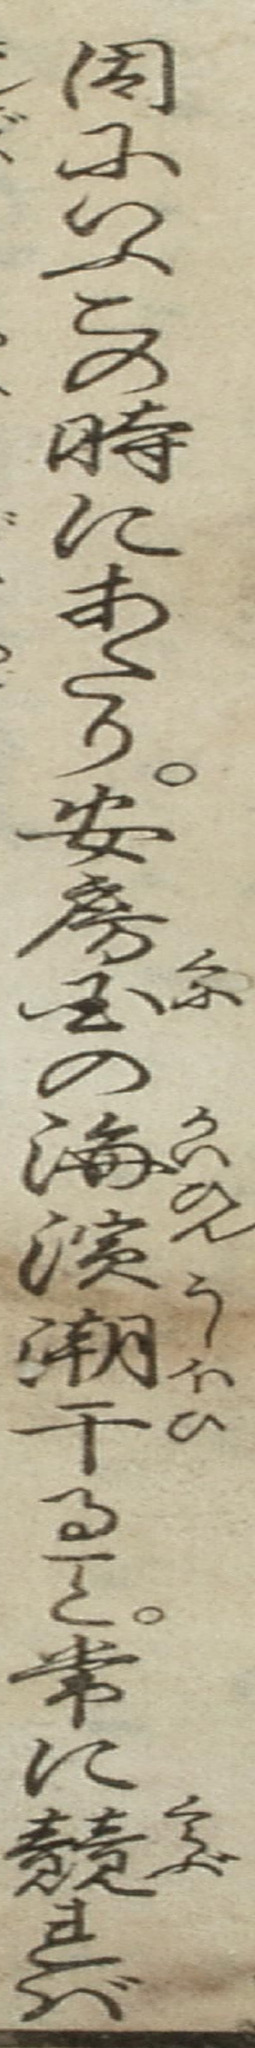因にいふこの時にあたり。安房国の海濱潮干ること。常に競れば
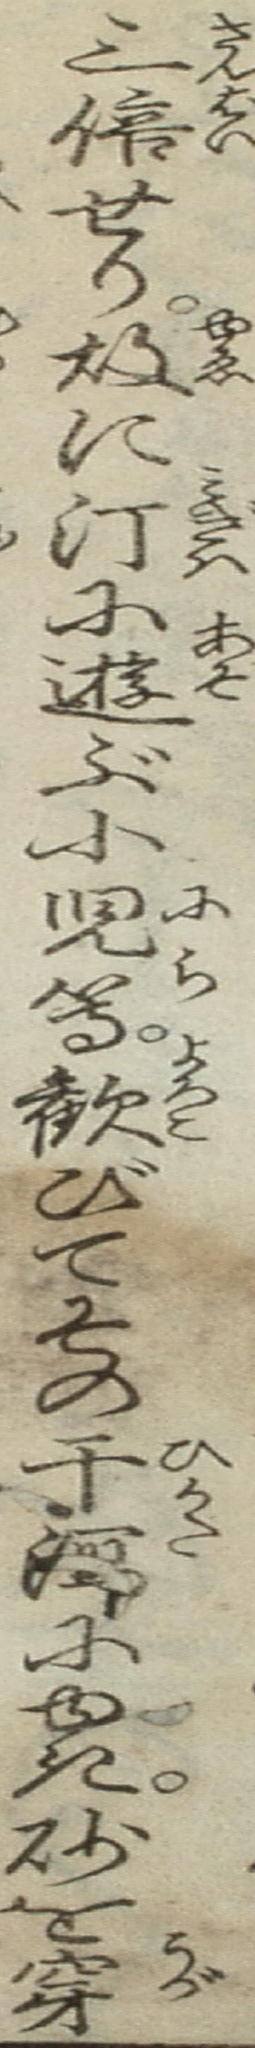三倍せり。故に汀に遊ぶ小児等。歓びてその干潟にゆき。砂を穿
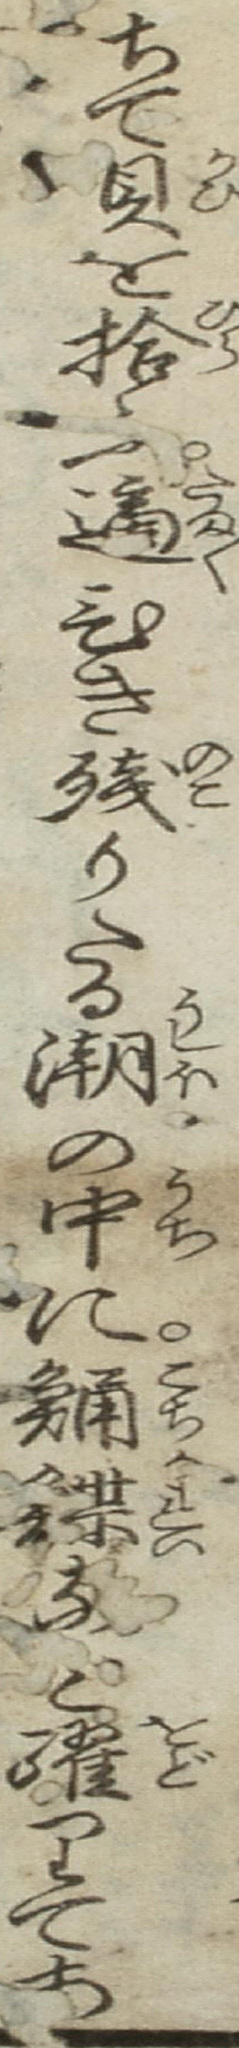ちて貝を拾ふ。適ひき残りたる潮の中に。鯒鰈など躍りてあ
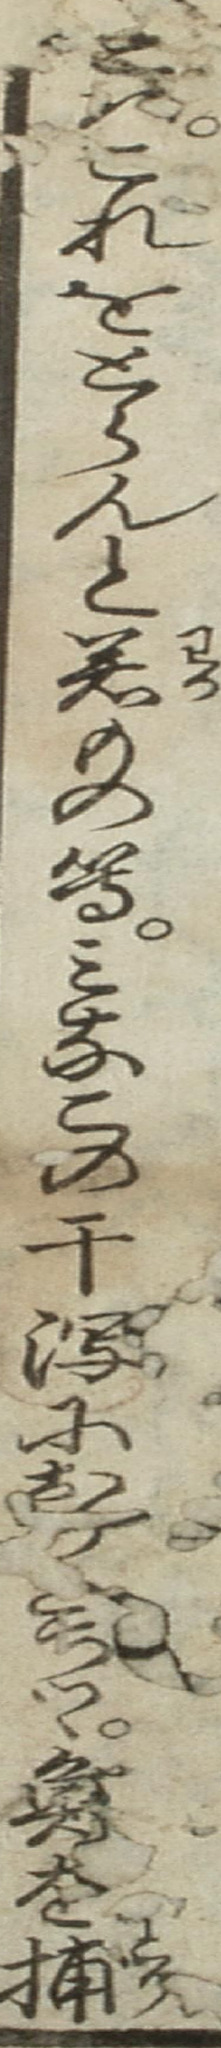れば。これをとらんと若もの等。みなこの干潟におりたちツヽ。魚を捕
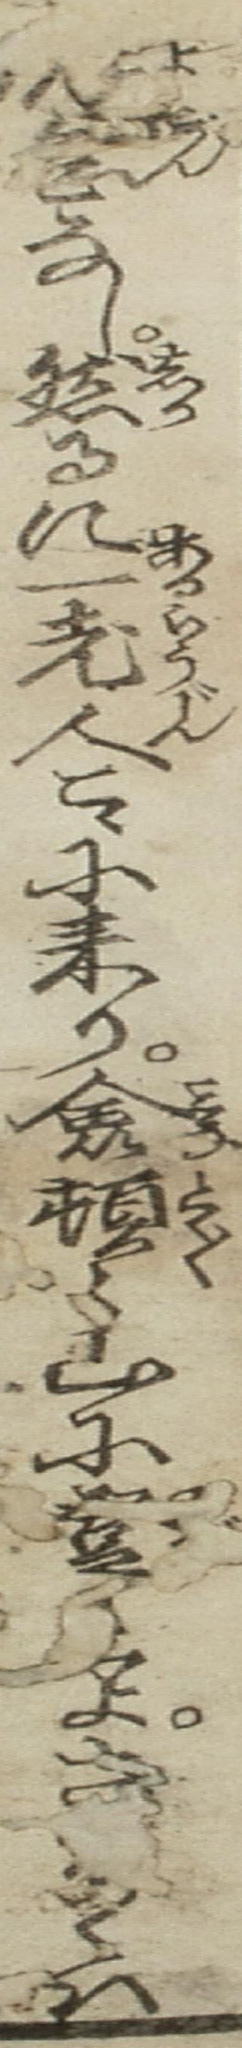余念なし。然るに一老人こゝに来り。僉頓〻山に登れよ。さなくは
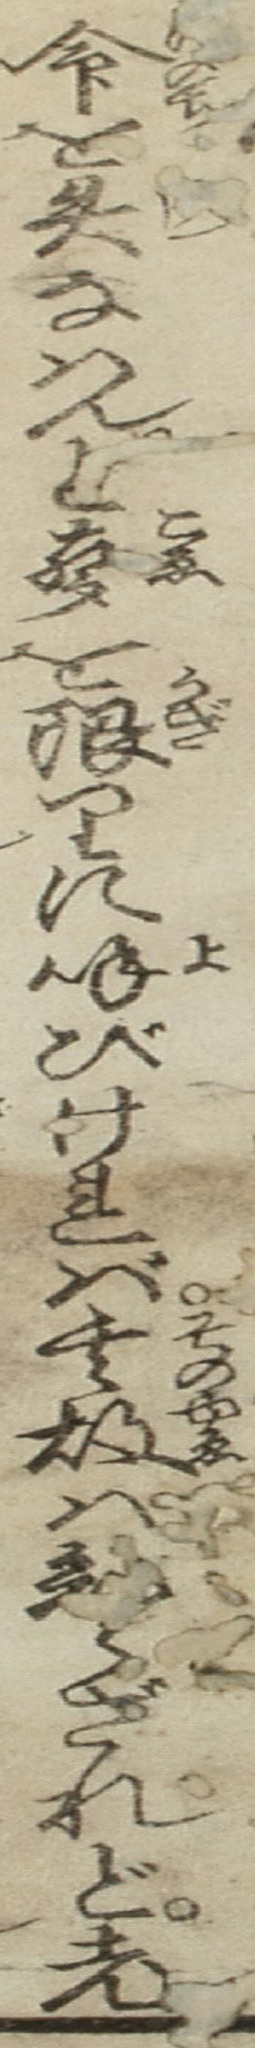命を失なはん。と声を限りに呼びければ。其故は知らざれど。老
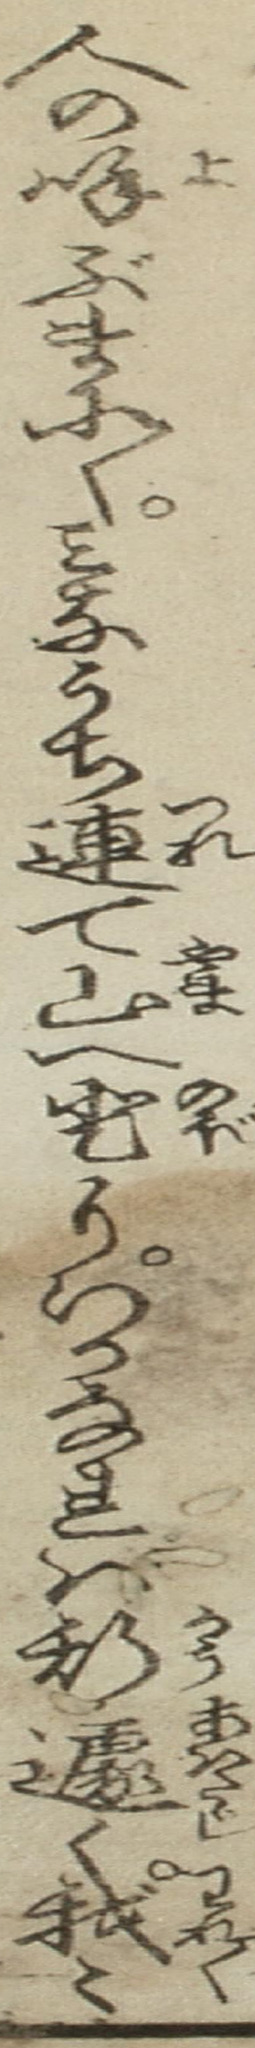人の呼ぶまに〳〵。みなうち連て山へ登り。いかなれば斯遽く。我〻
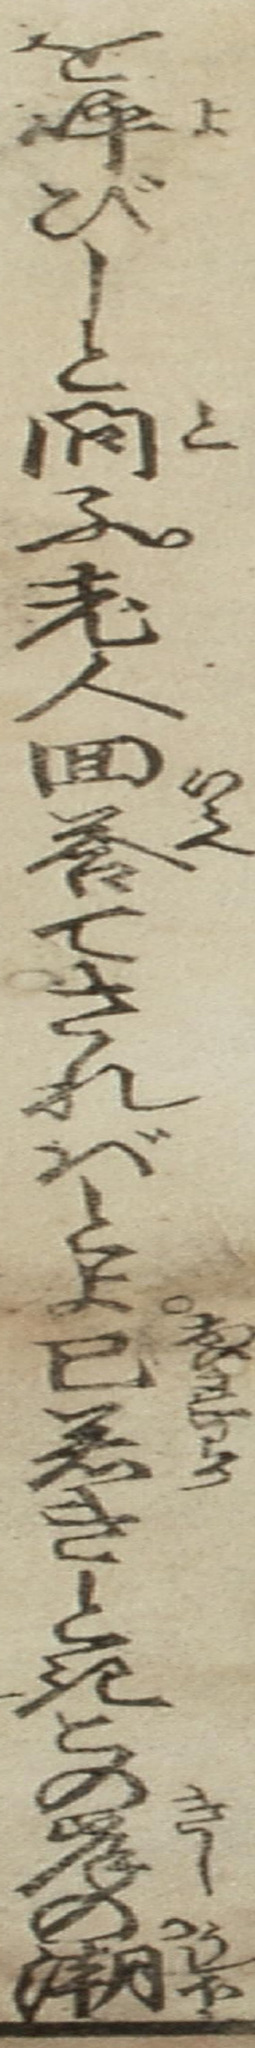を呼びしと問ふ。老人回答てさればとよ。己若きときこの岸の。潮
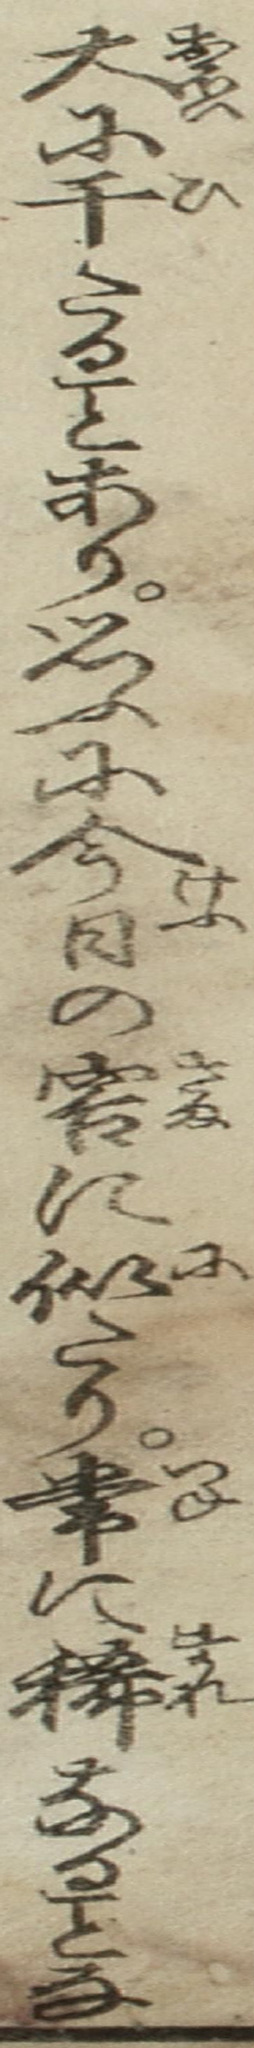大に干たることあり。思ふに今日の容に似たり。常に稀なることな
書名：安政見聞録　中
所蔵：東京大学地震研究所図書室 Earthquake Research Institute Library, The University of Tokyo, JAPAN
